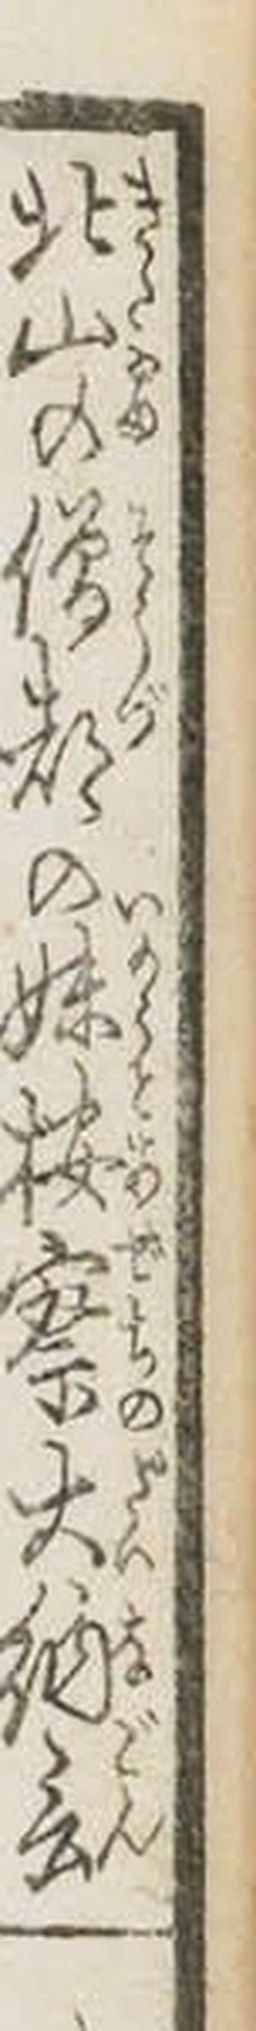北山の僧都の妹按察大納言
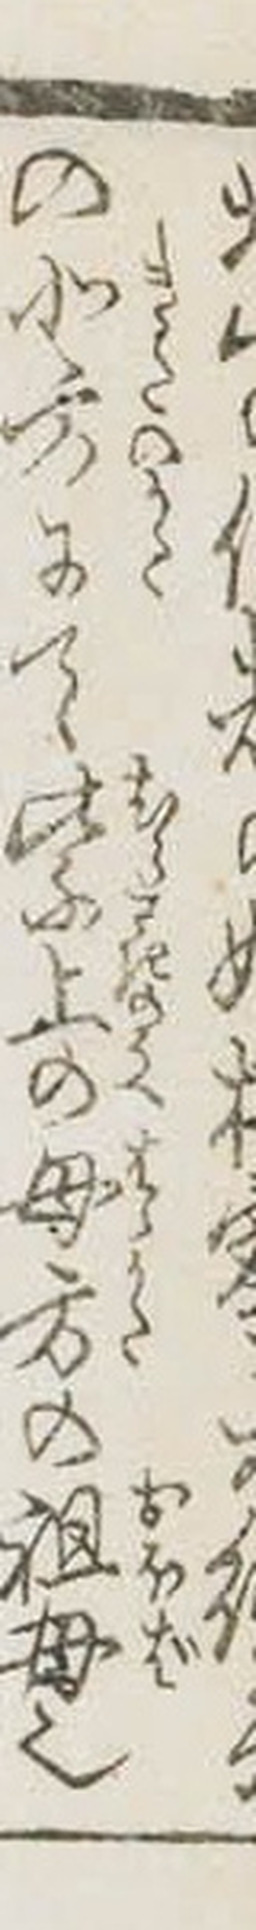の北方にて紫上の母方の祖母也
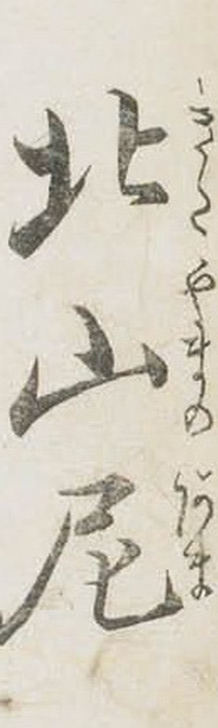北山尼
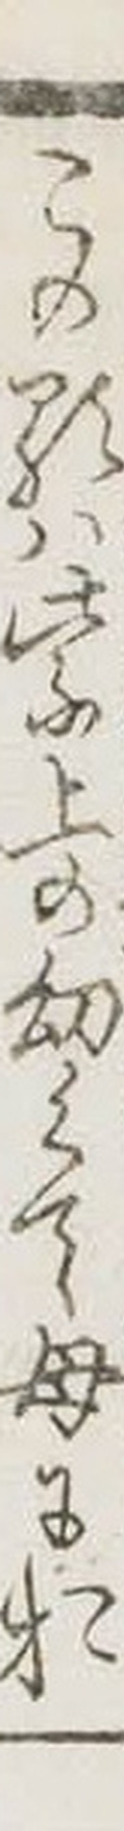この歌は紫上の幼くて母にお
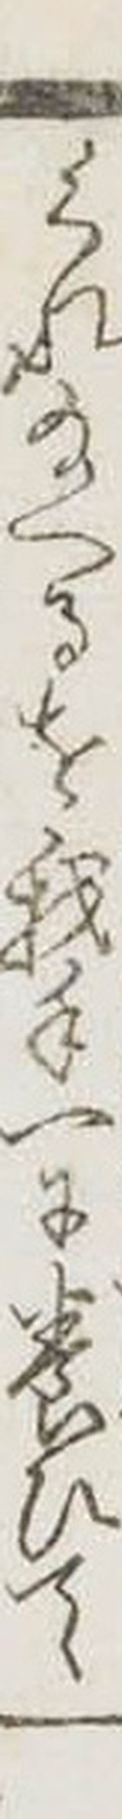くれ給へるを我手一に養ひて
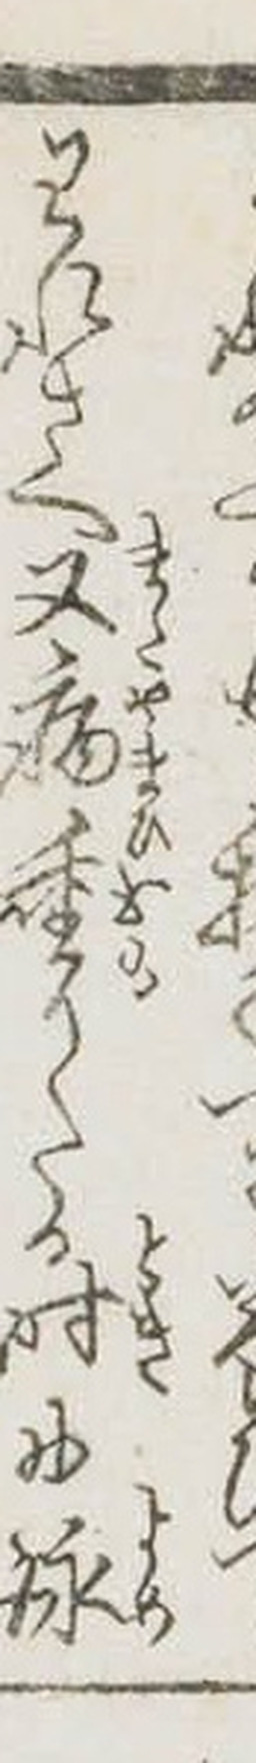われさへ又病重りたる時に詠
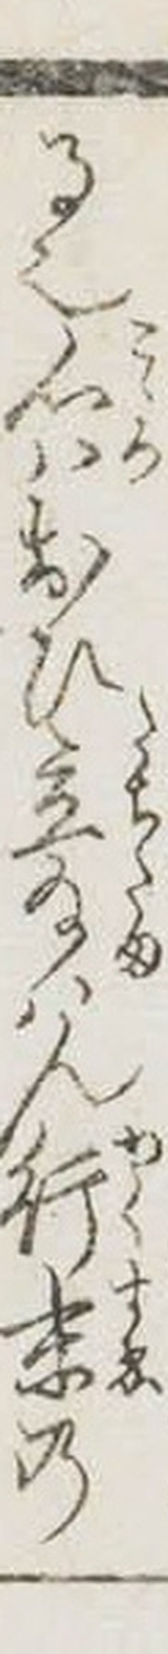る也心はおひ立給はん行末の
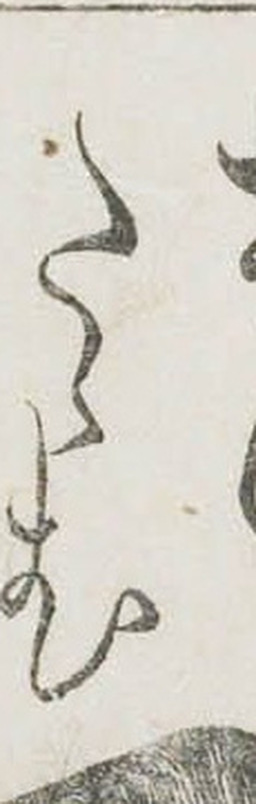たゝむ
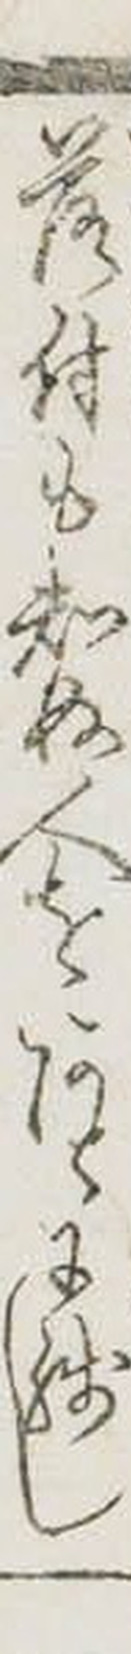落付も知ぬ人をあとに残し
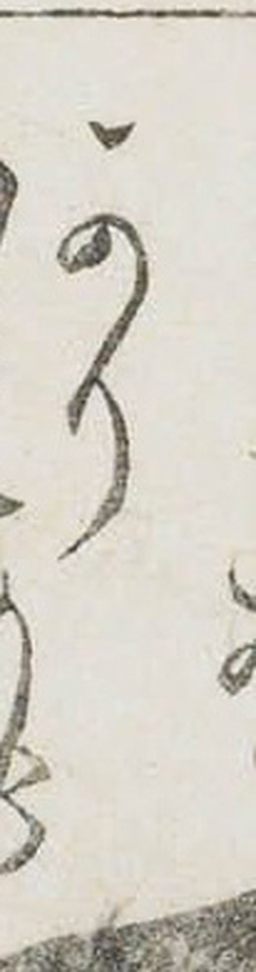ありかも
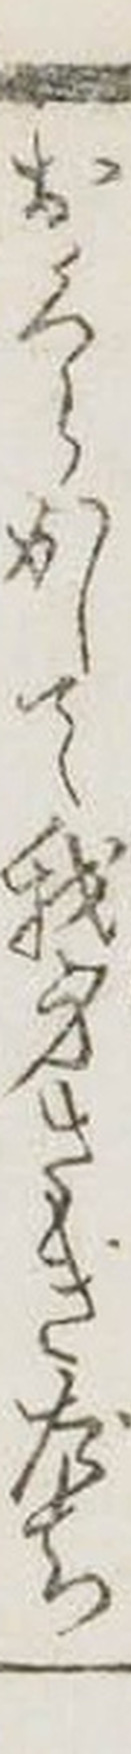おくらかして我身さきだち
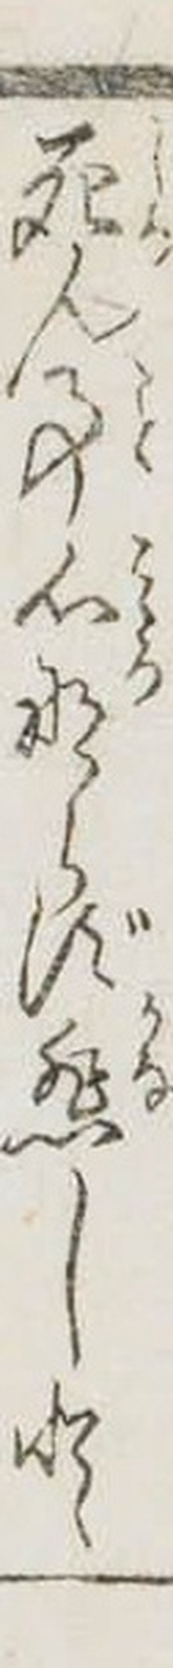死ん事心ならず悲しと
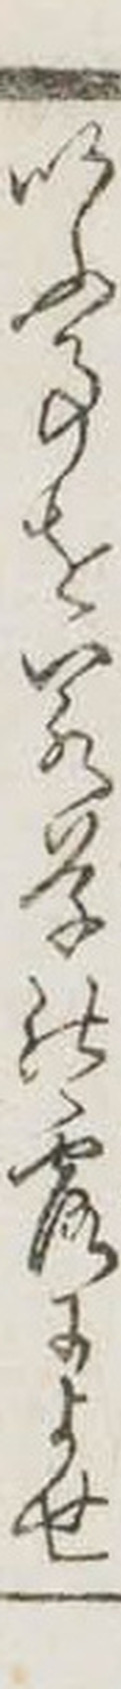いふ事を若草の露によせ
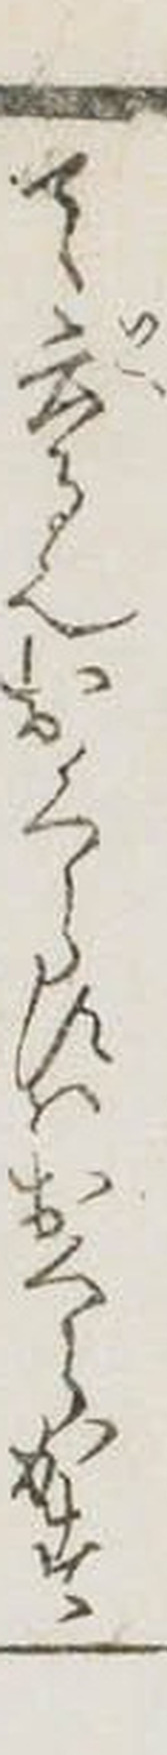て云る也おくらすはおくらかす
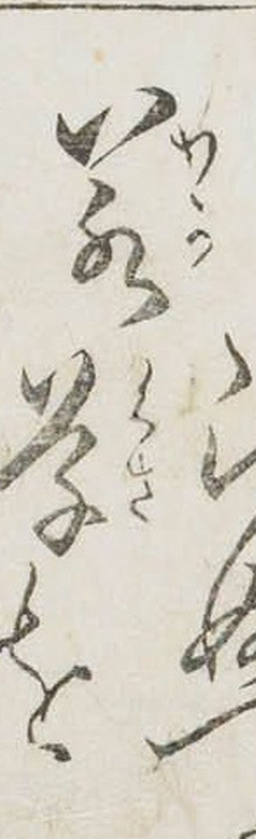若草を
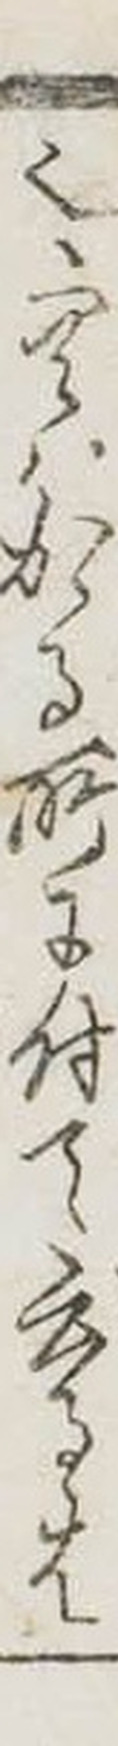也空はかゝる所に付て云るは
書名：源氏百人一首
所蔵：東京学芸大学教育コンテンツアーカイブ
